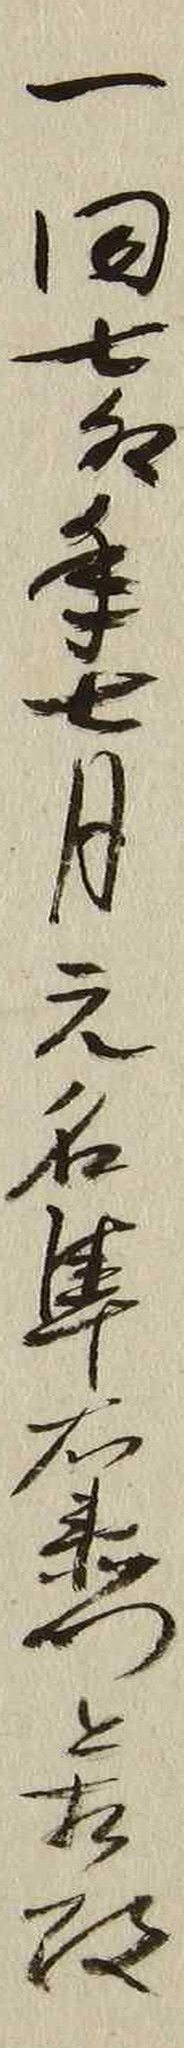一同七卯年七月元名隼右衛門と相改
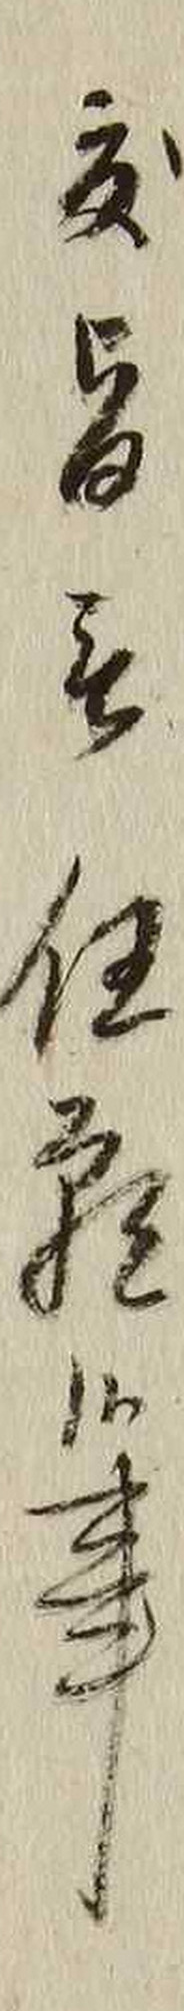度旨被任願候事
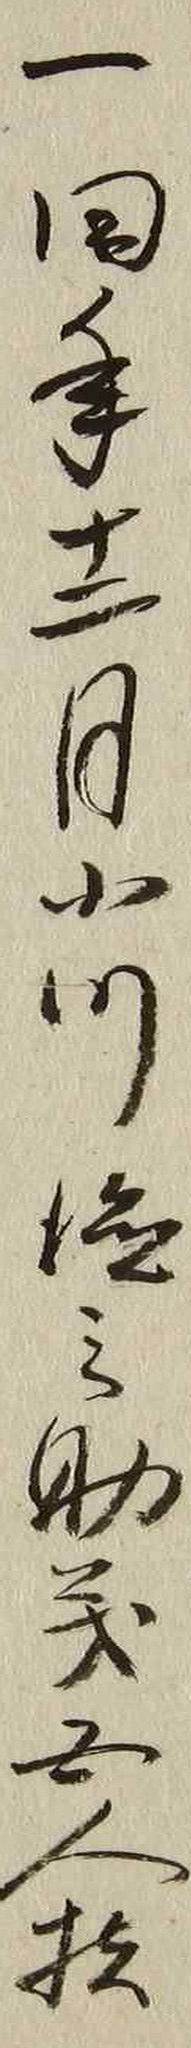一同年十二月小門塩之助義五人扶
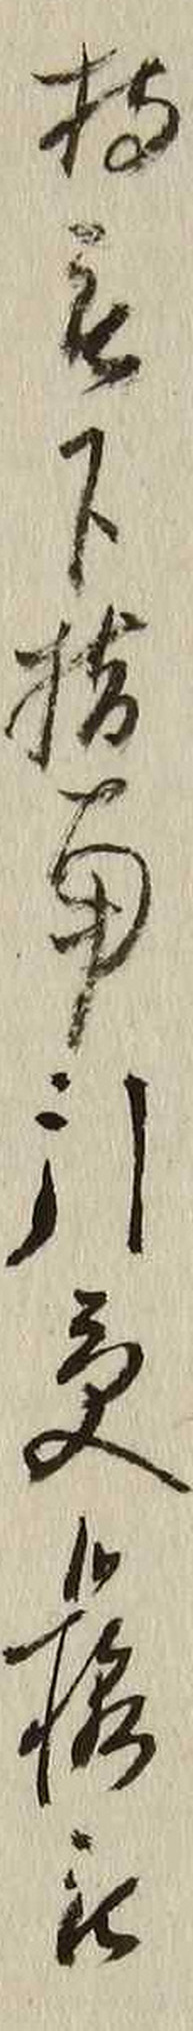持被下指南引受候様被
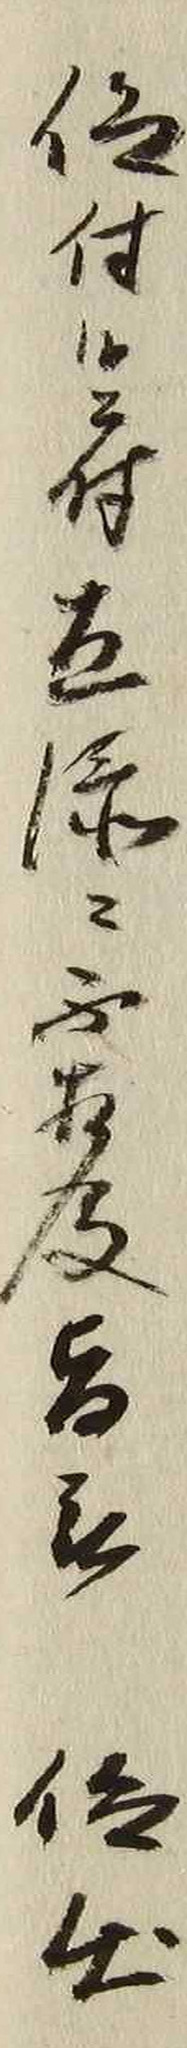仰付候ニ付立添ニ不相及旨被仰出
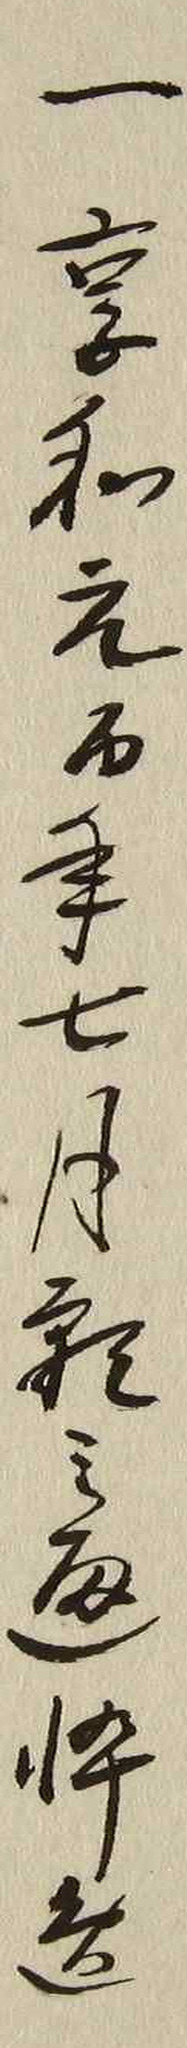一享和元酉年七月願之通忰逸
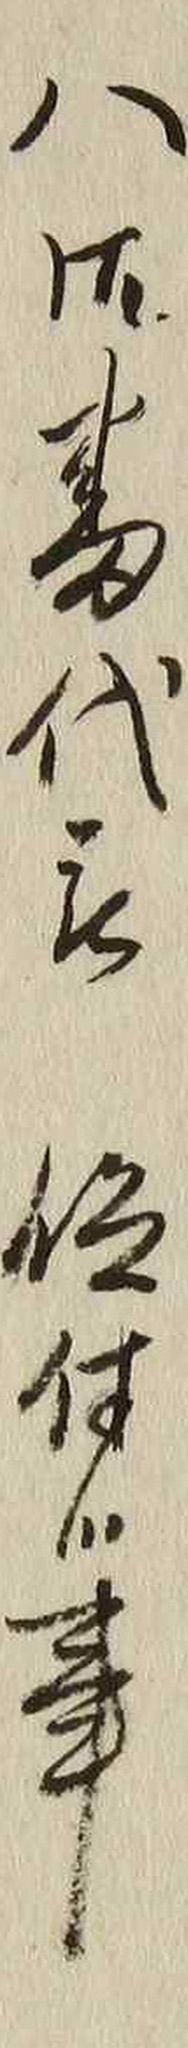八御番代被仰付候事
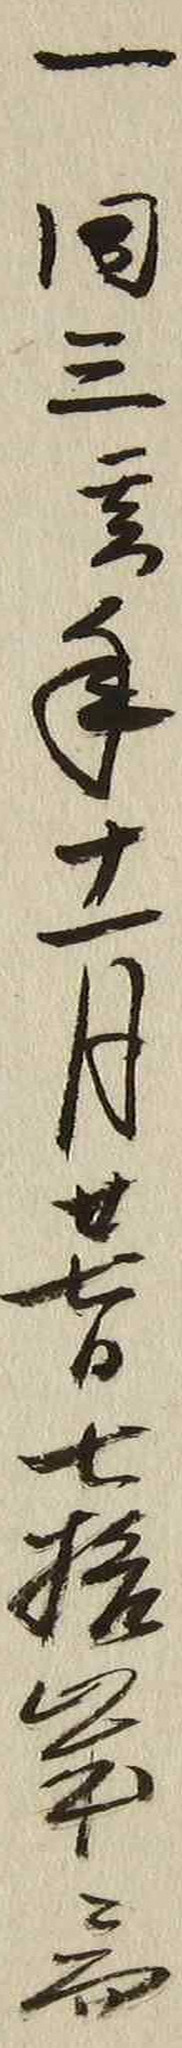一同三亥年十一月廿七日七拾歳ニ而
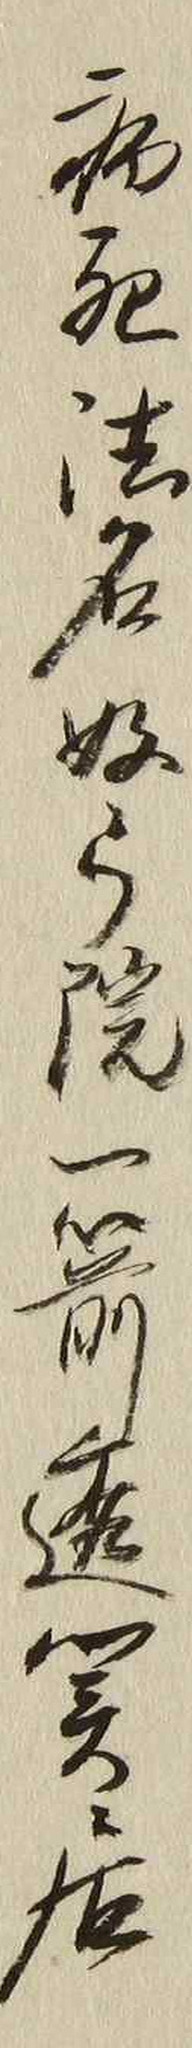病死法名好弓院一箭透関居
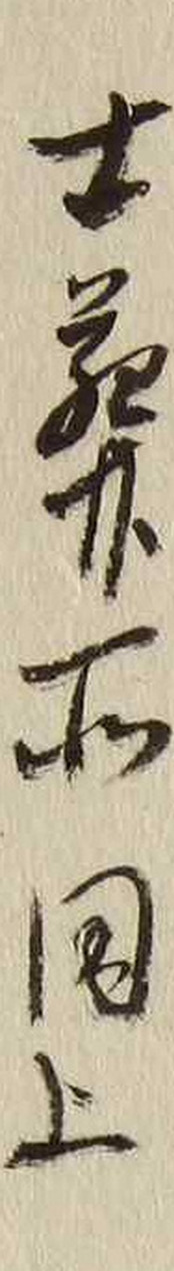士葬所同上
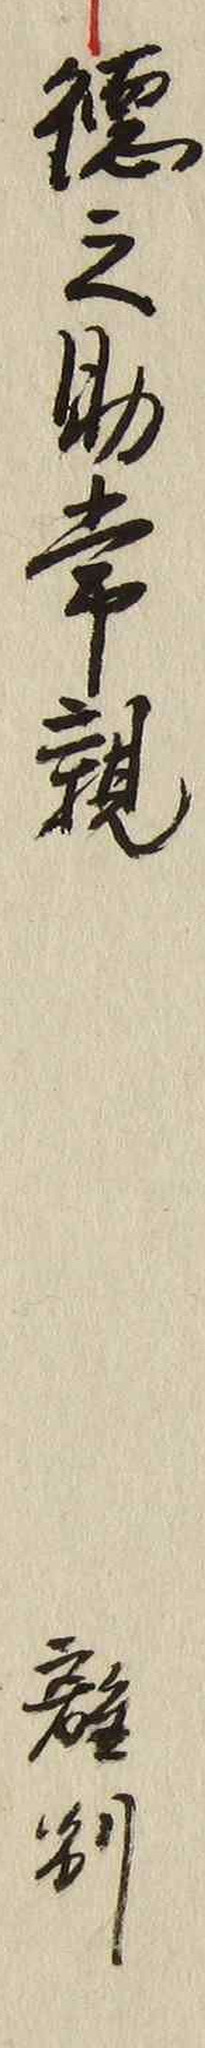徳之助常親離別
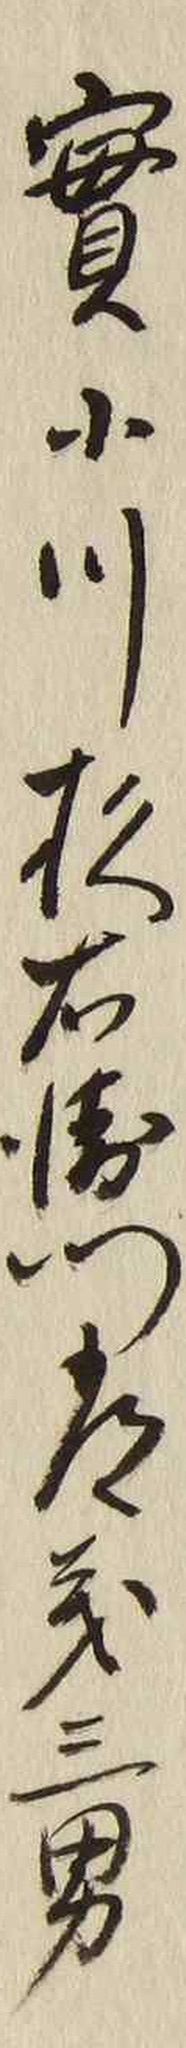実小川杉右衛門常義三男

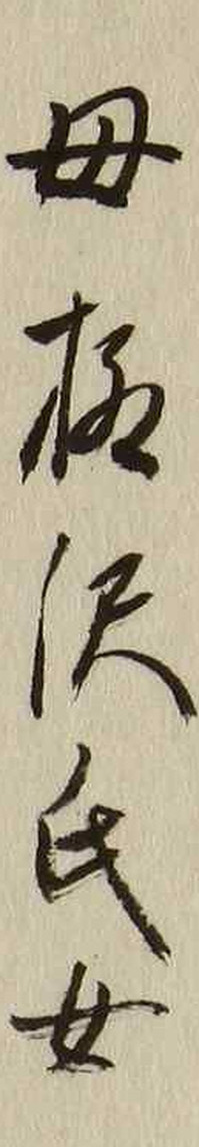母柳沢氏女
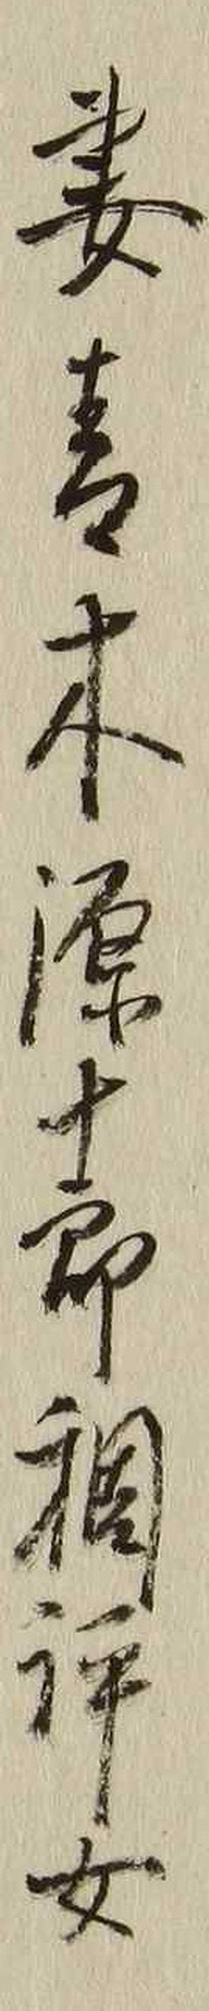妻青木源十郎稠評女
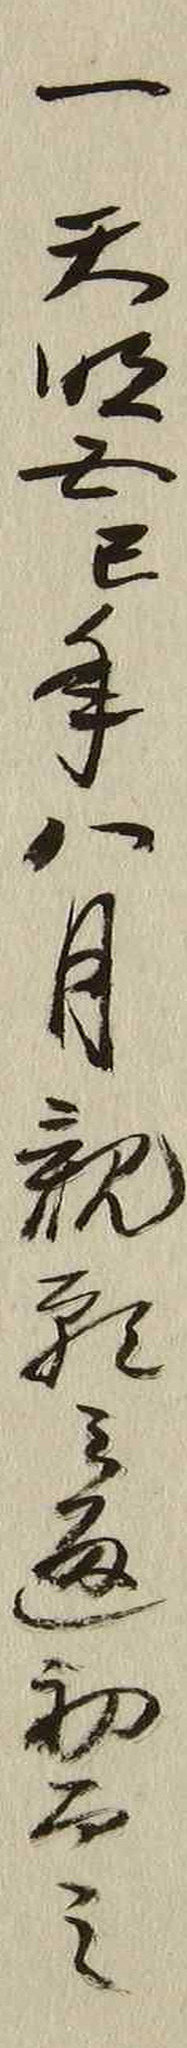一天明五巳年八月親願之通初而之
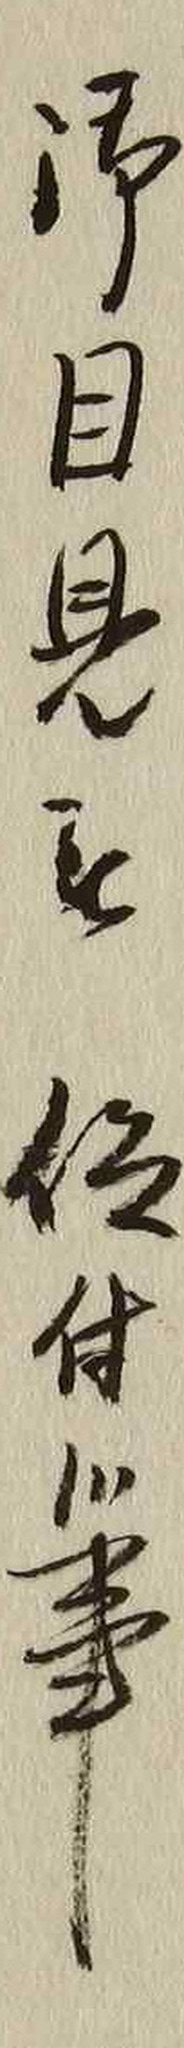御目見被仰付候事
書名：諸士系譜　巻之346　も之部2
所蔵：会津若松市立会津図書館
